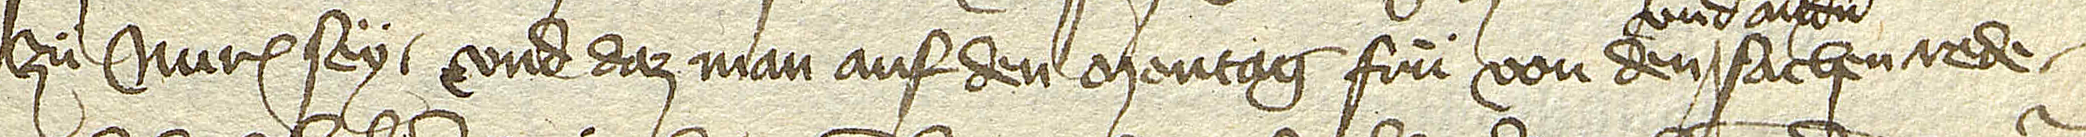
cʒü Nur* ſey / vnd daʒ man auf den Montag frü von den ſachen rede /
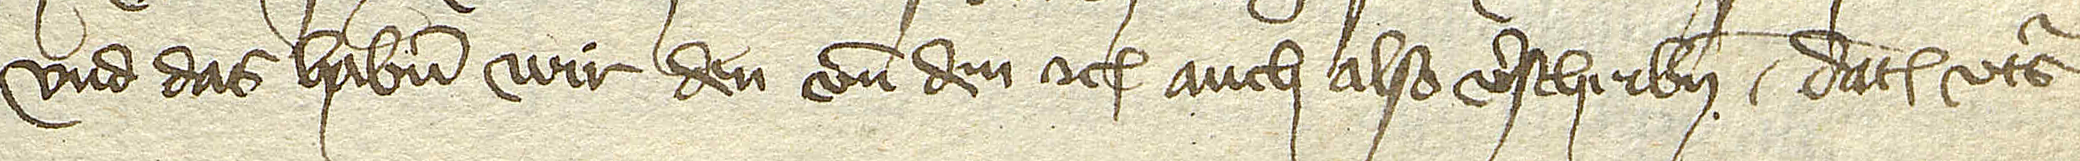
vnd das habn* wir den vn* den ec* auch alſo v*ſchribn* / dat* vts*
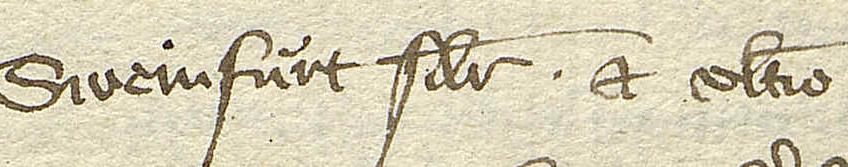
Sweinfürt ſilr* % vltio*
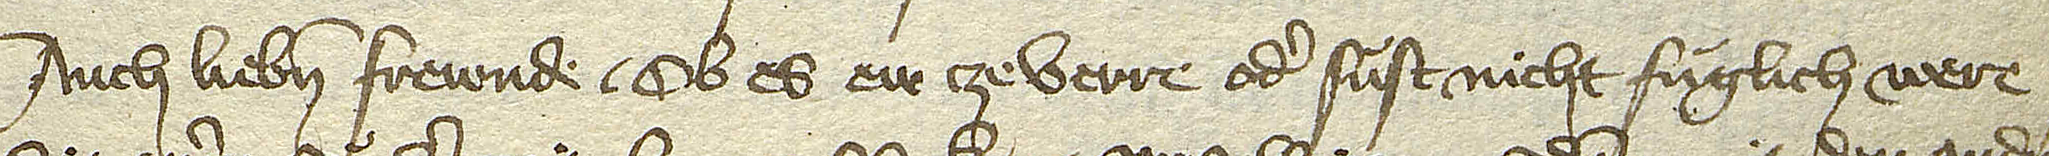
Auch liebn* frewnde / Ob es ew cʒeverre od* ſüſt nicht füglich were
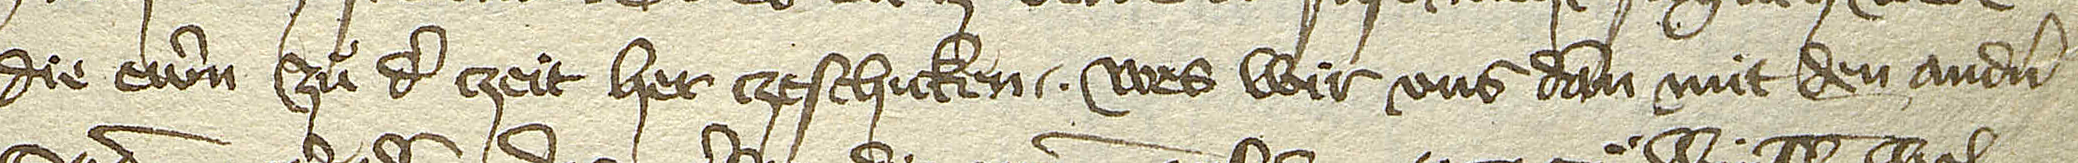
die ew*n cʒu d* cʒeit her cʒeſchicken / . wes wir vns dan* mit den andn*
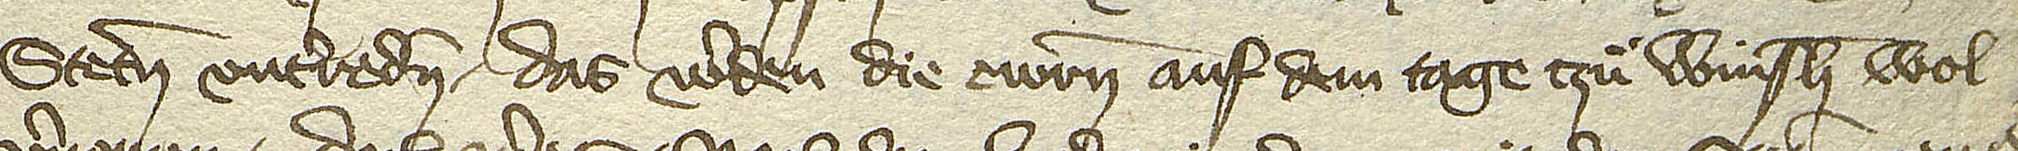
Stetn* vnt*redn* / das w*den die ewrn* auf dem tage cʒü Winſh* wol
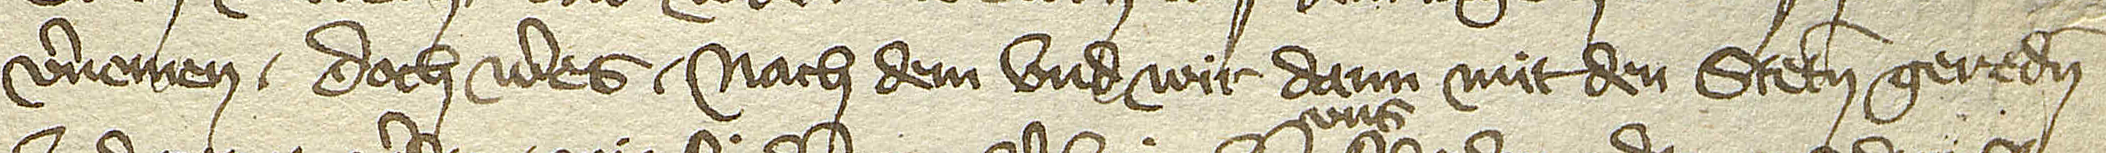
v*nemen / Doch w*es / Nach dem vnd wir dann mit den Stetn* geredn*
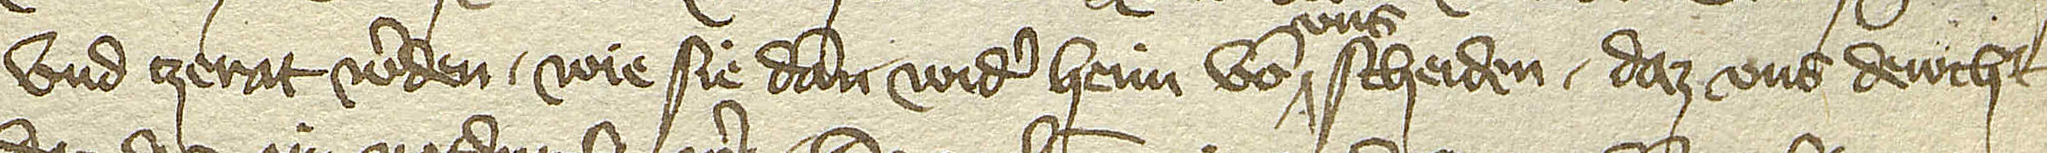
vnd cʒerat w*den / wie ſie dan* wid* heim vo* ſcheiden / daʒ vns dewcht
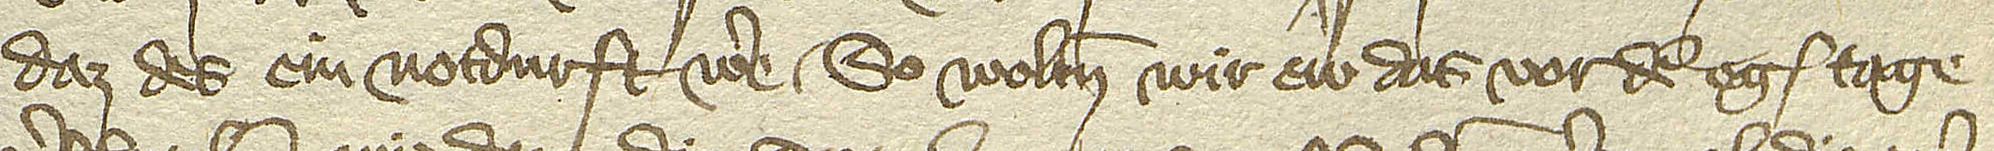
daʒ des ein notdurft w*e / So woltn* wir ew das vor d* eg* tage
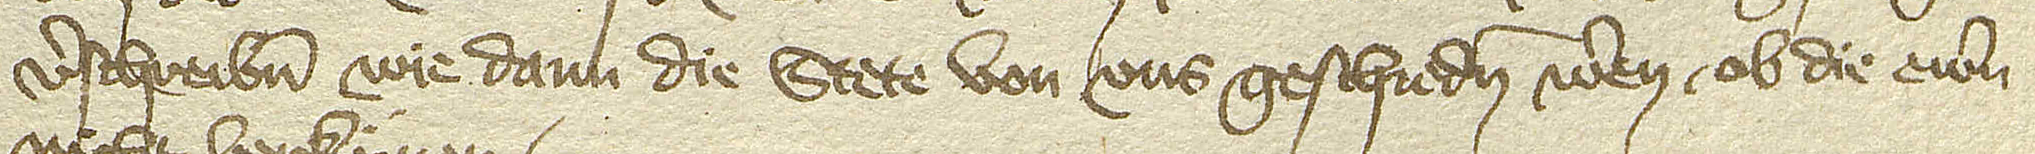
v*ſchreibn* wie dann die Stete von vns geſchiedn* w*en / ob die ew*n
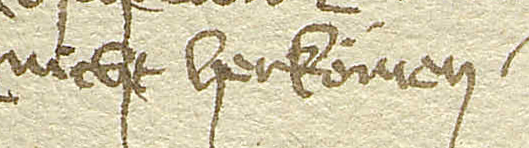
nicht herkömen /
